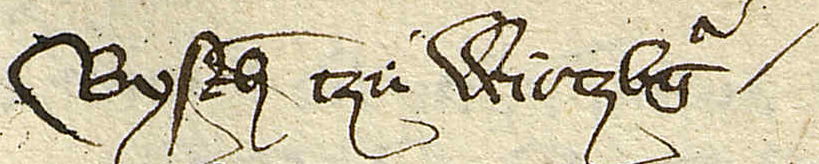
Byſch* cʒü Wircʒb*g /
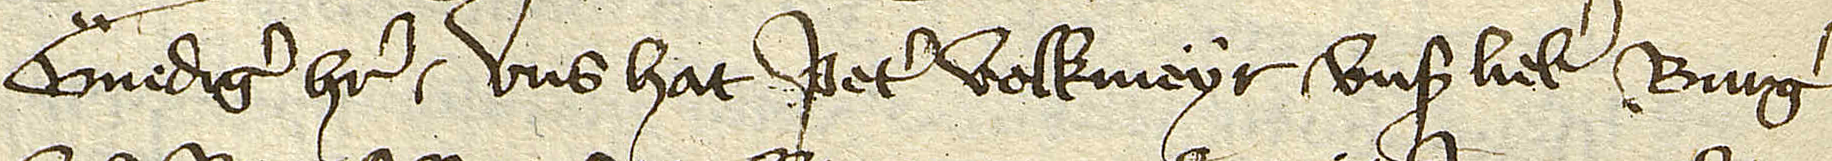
Gnedig* hr* / Vns hat Pet* Volkmeyr / vnſ* lieb* Burg*
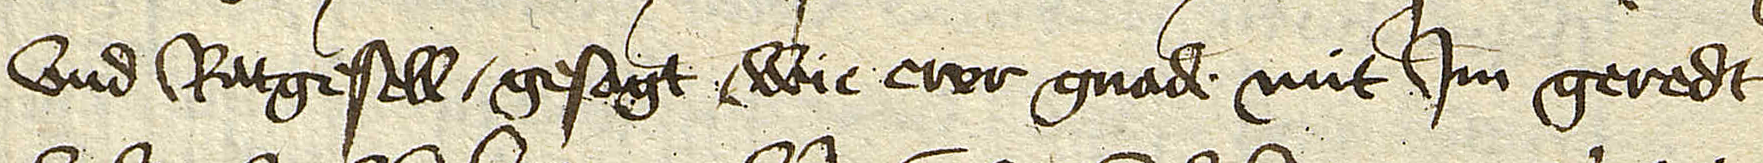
vnd Ratgeſell / geſagt / wie ewr gnad mit Im geredt
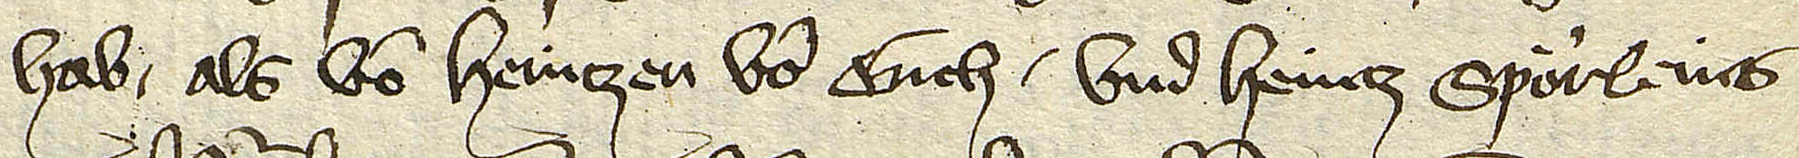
hab / als vo* Heincʒen vo* Gich / vnd heincʒ Spörleins
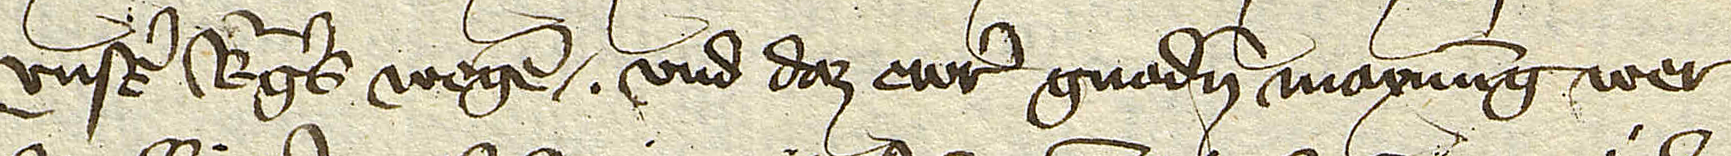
vnſs* B*g*s wege* / . vnd daʒ ewr* gnadn* maynug* wer
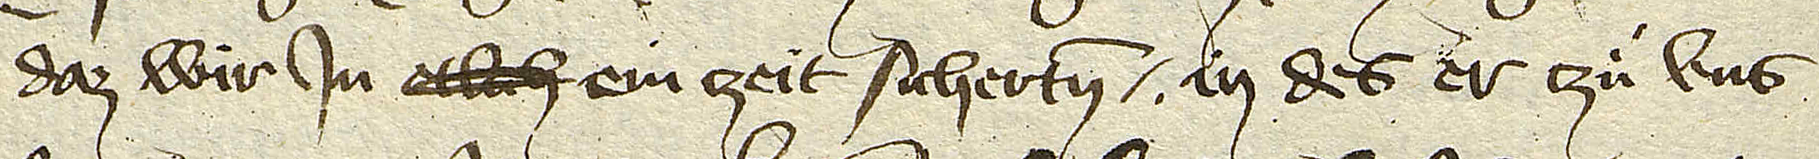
daʒ wir In etlich ein cʒeit ſichertn* / . in des er cʒü vns
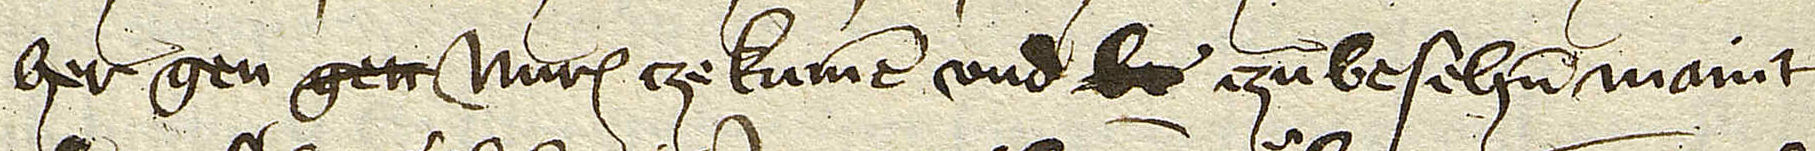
her gen gen Nur* cʒe kume* vnd be cʒu beſehn* maint
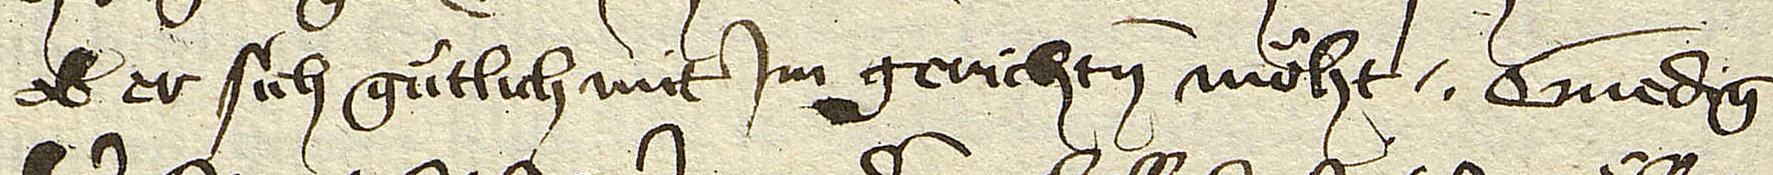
ob er ſich gütlich mit Im gerichtn* möht / . Gnedig*
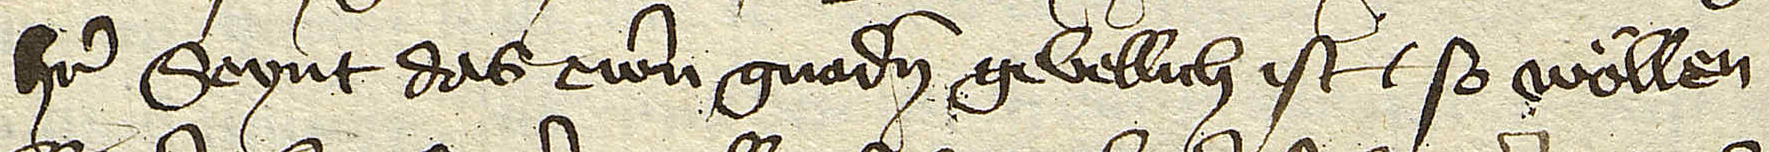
hr* Seynt das ew*n gnadn* gevellich iſt / ſo wöllen
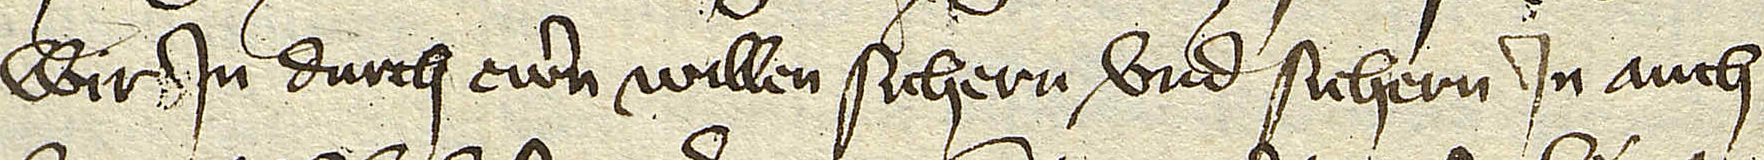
wir In durch ew*n willen ſichern / vnd ſichern In auch
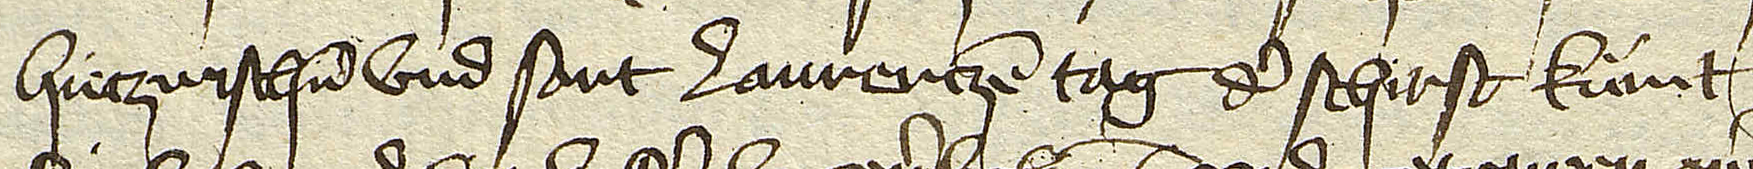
hiecʒwiſchn* vnd ſant Laurencʒe* tag d* ſchirſt kümt
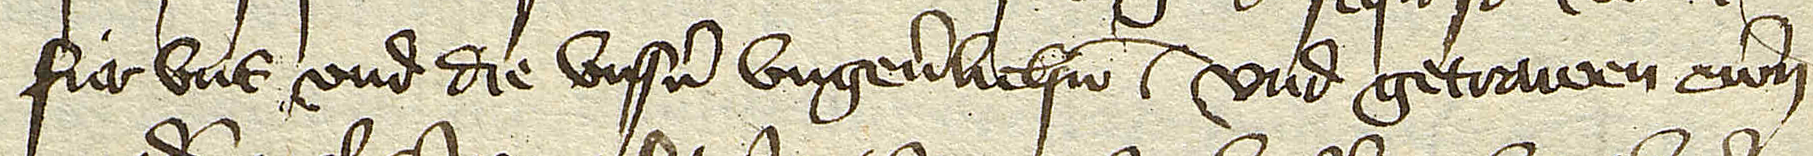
für vns vnd die vnſn* vngeu*lichn* / vnd getrawen ew*n
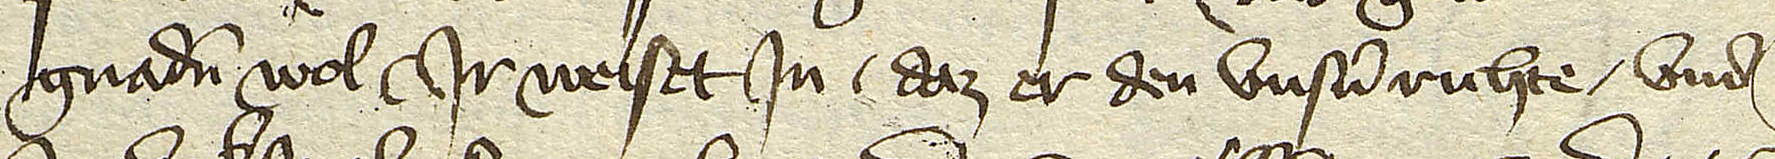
gnadn* wol / Ir weiſet In / daʒ er den vnſn* richte / vnd
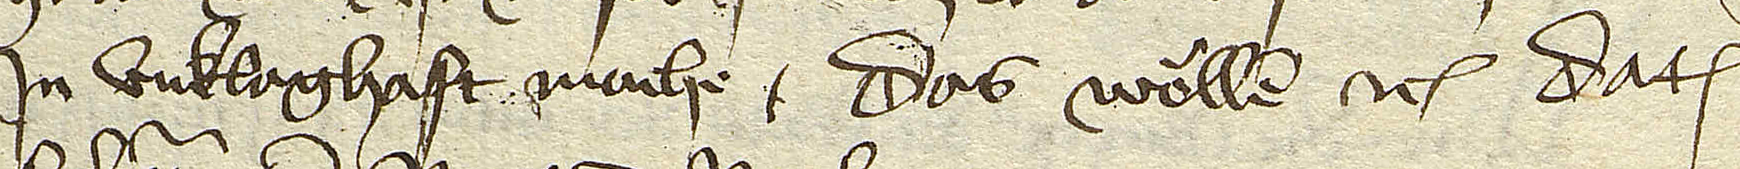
In vnklaghaft mache / Das wölle* ec* Dat*
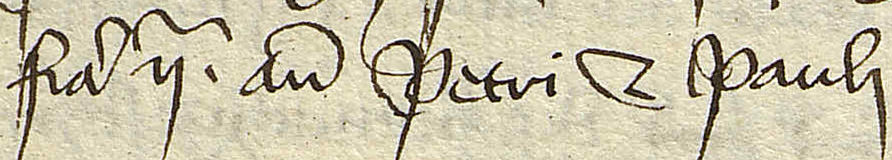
fia* ii* . an* Petri @Pauli
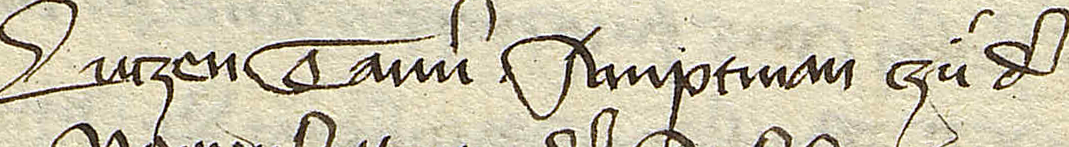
Lucʒen Tann* . Amptman cʒü d*
